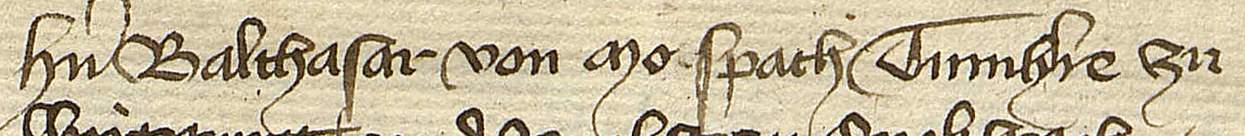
hn* Balthaſar von Moſpach Tumh*re cʒu
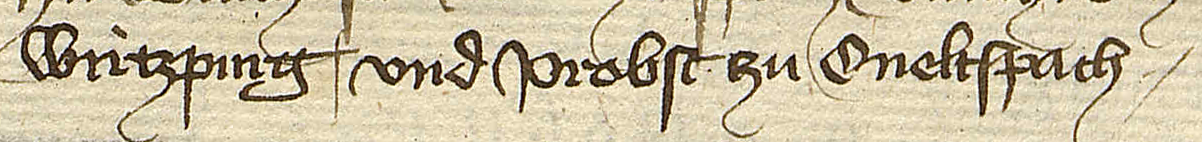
wircʒpurg* vnd Probſt cʒu Oneltſpach /
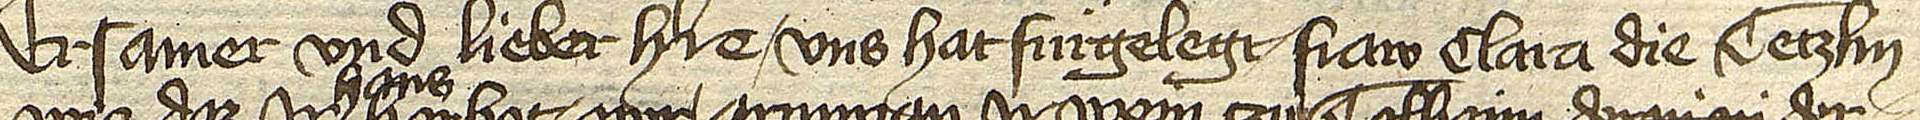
Erſamer vnd lieber h*re / vns hat fürgelegt fraw Clara die Tecʒlin
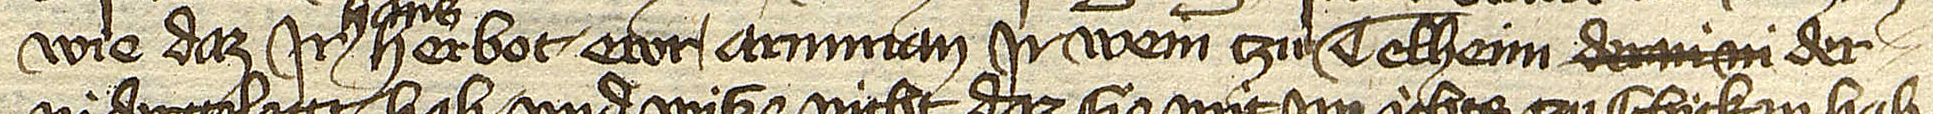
wie daʒ Ir herbot / ewr / armman Ir wein cʒu Telheim derni ni der
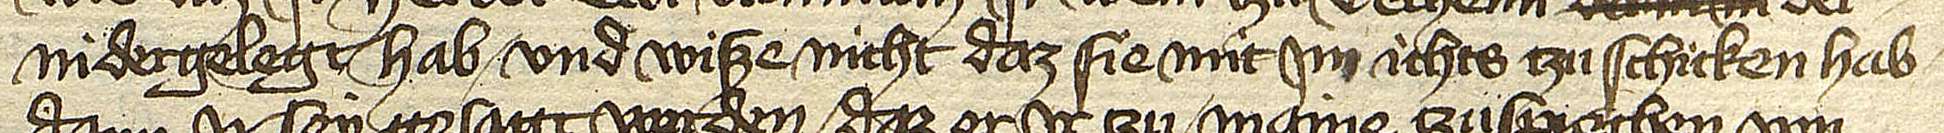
nidergelegt hab / vnd wiſʒe nicht daʒ ſie mit Im ichts cʒu ſchicken hab /
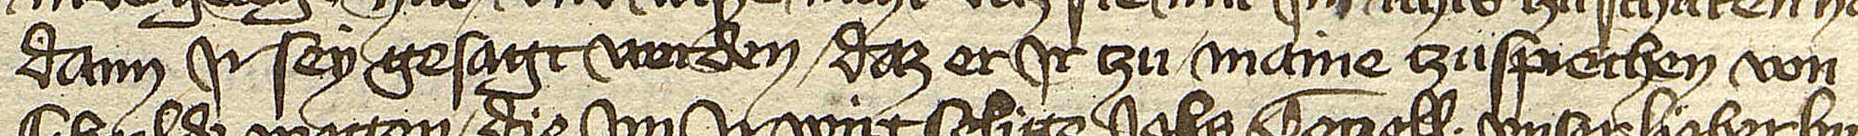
dann Ir ſey geſagt worden / daʒ er Ir cʒu / maine cʒuſprechen von
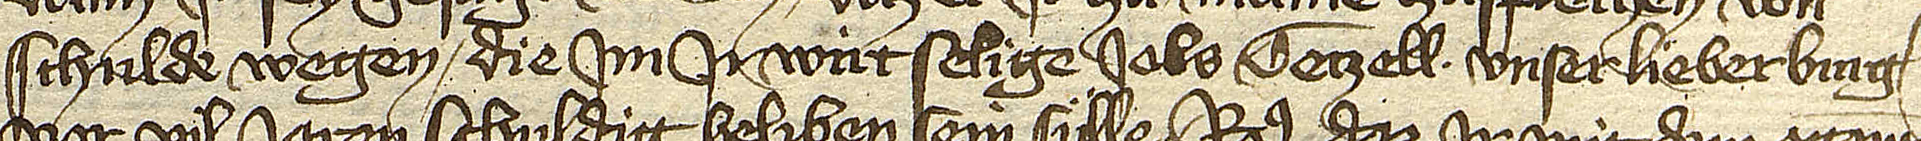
ſchulde wegen / die Im Ir wirt ſelige Iobs Tecʒell . vnſer lieber burg*
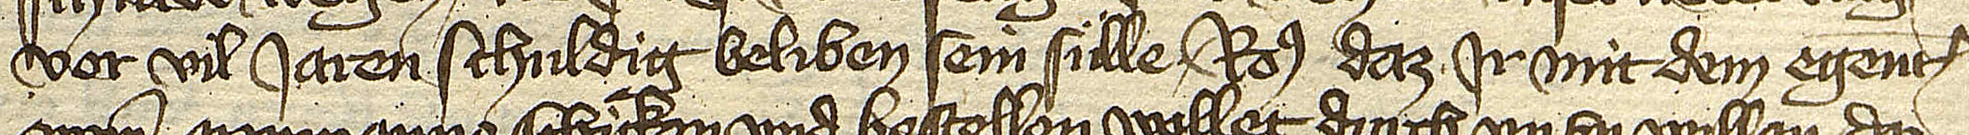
vor vil Iaren ſchuldig beliben ſein ſülle / Ro* daʒ Ir mit dem egent*
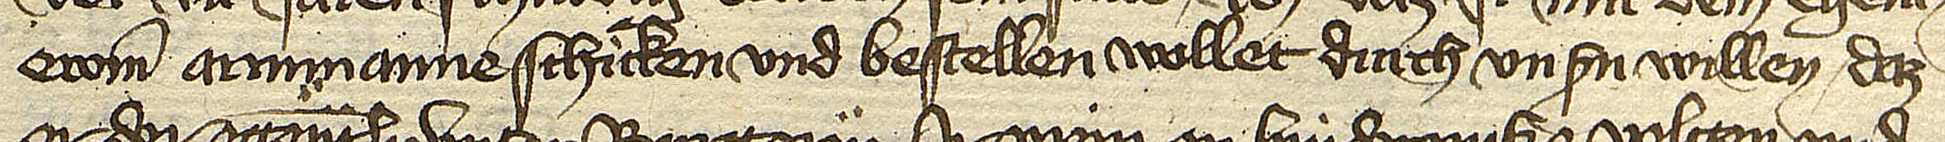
ewm* armmanne ſchicken vnd beſtellen wellet durch vnſ*n willen / daʒ
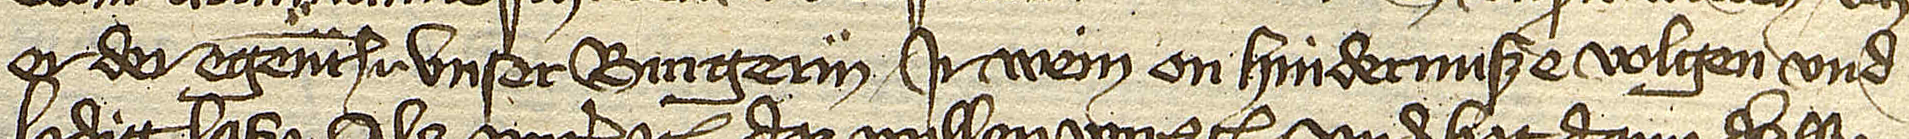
er der egen*t* ~ vnſer Burgerin / Ir wein on hindernuſʒe volgen vnd
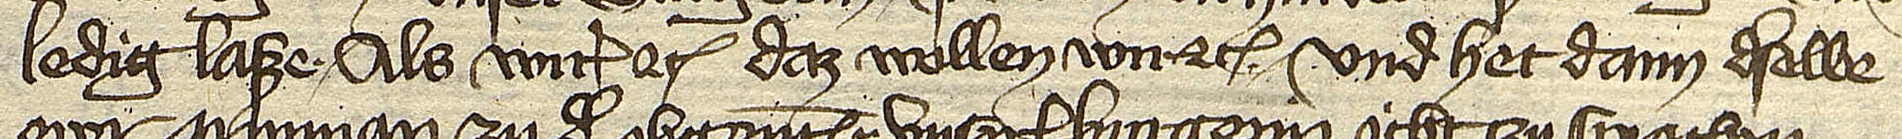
ledig laſʒe . / Als wir* ec* daʒ wollen wir ec* vnd het dann d*ſelbe
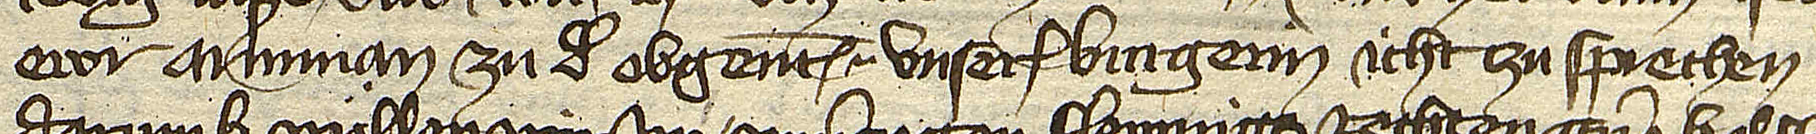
ewr armman cʒu d* obgen*t* ~ vnſer* burgerin icht cʒu ſprechen
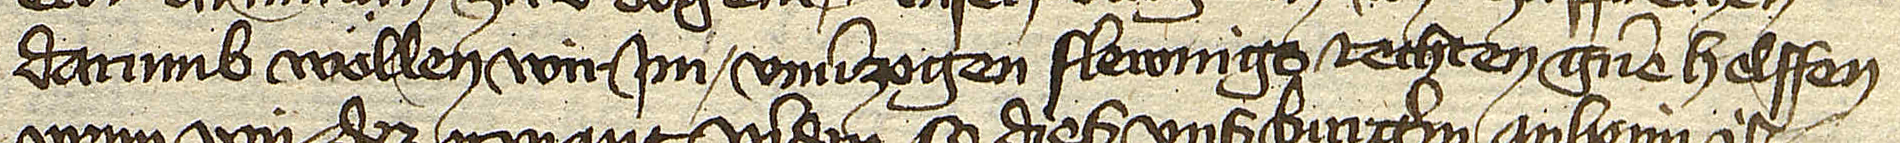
darumb wöllen wir Im / vnu*cʒogen ſlewnigs recht gn*e helffen
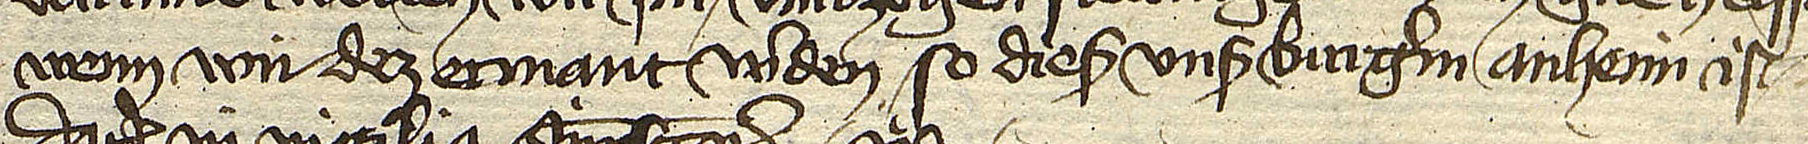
wenn wir deʒ ermant w*den / ſo dieſ* vnſ* burg*in anheim iſt /
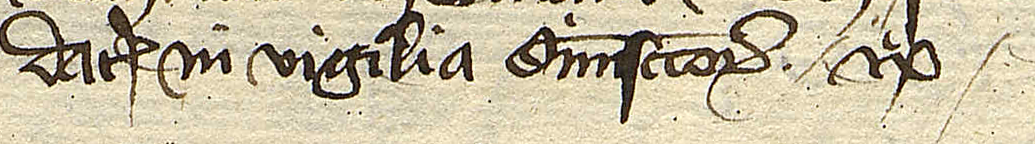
Dat* in vigilia Omiſctor* . / ix* /
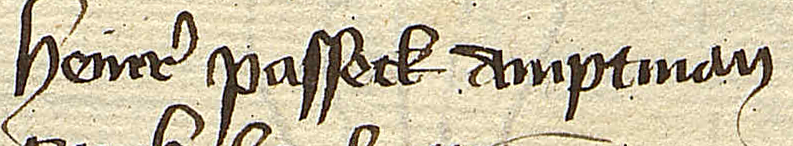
heinr* paſſeck Amptman
